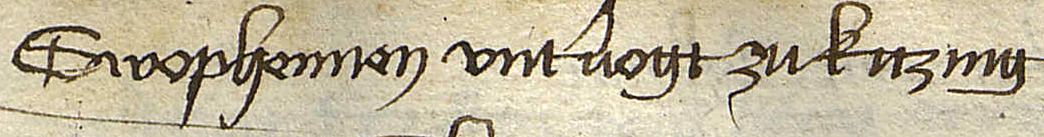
Swopheimen vnt*uogt ʒu kicʒing
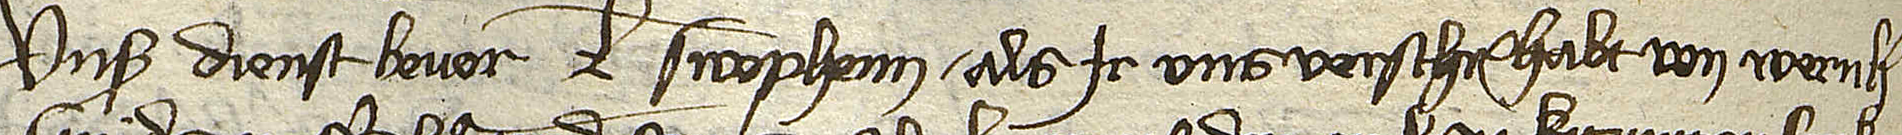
Vnſ* dienſt beuor L* ſwopheim / als Ir vns verſchr* habt von wernh*
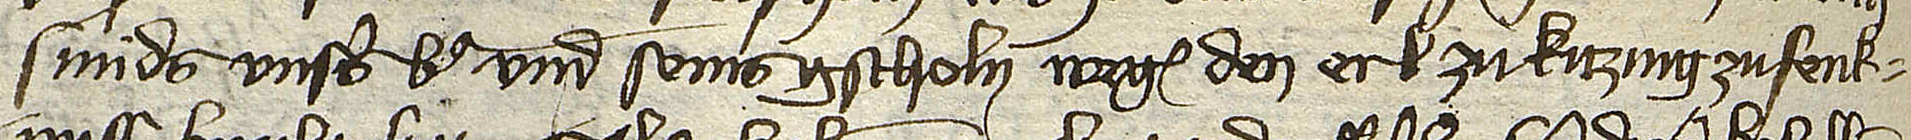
ſmids vnſ*s b* vnd ſeins gſcholn weg* den er* ʒu kicʒing ʒu fenk =
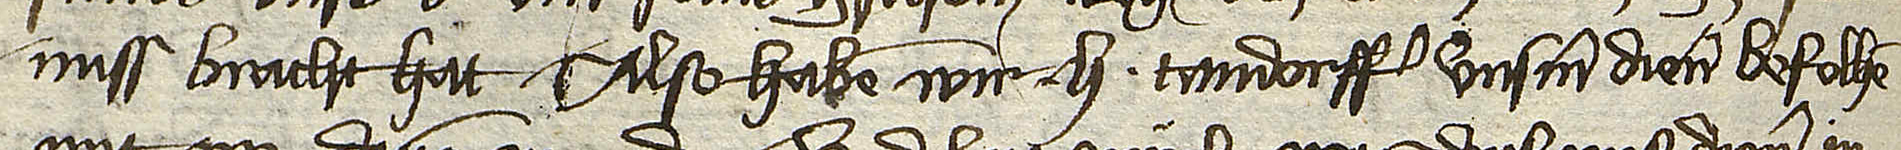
nuſſ bracht hat / Alſo habe* wir . h* . tandorff* vnſ*m dien* befolhe*
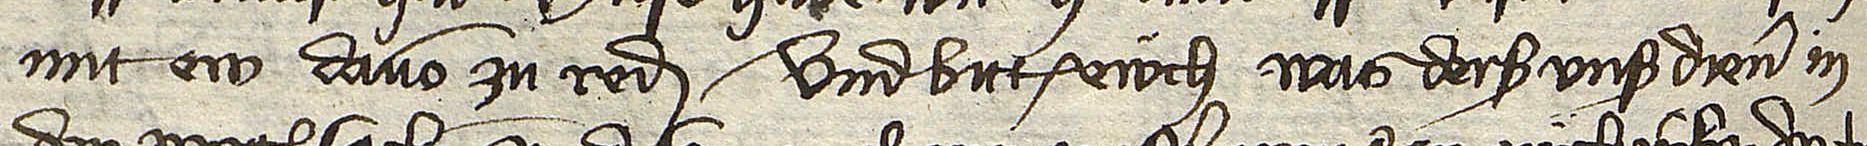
mit ew dauo* ʒu red* / Vnd bitt* ewch . was derſ* vnſ* dien* in
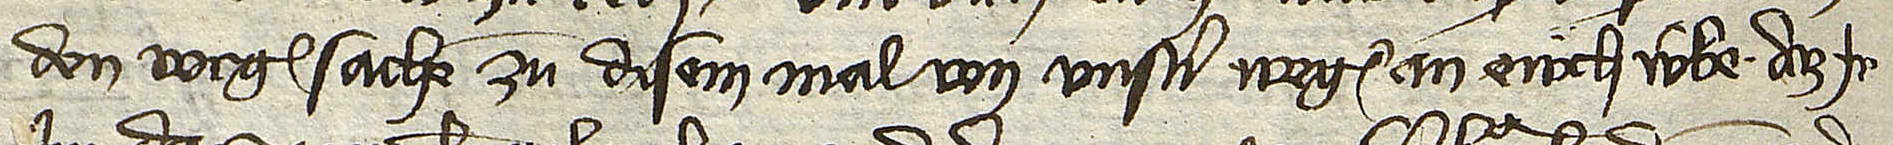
den vorg* ſache* ʒu diſem mal von vnſ*n weg* an ewch w*be . daʒ Ir
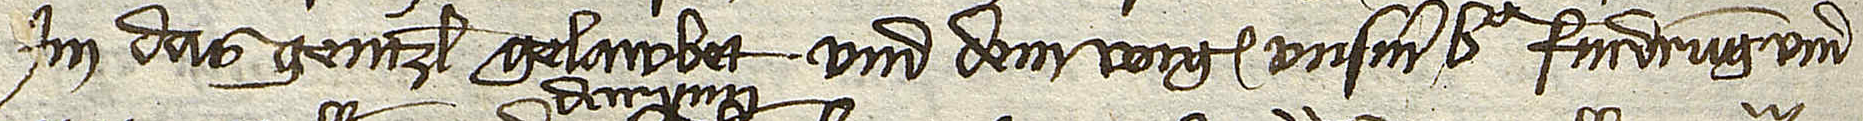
Im das gencʒl* gelawbet vnd dem vorg* vnſ*m b* furdrug* vnd
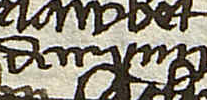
darynn
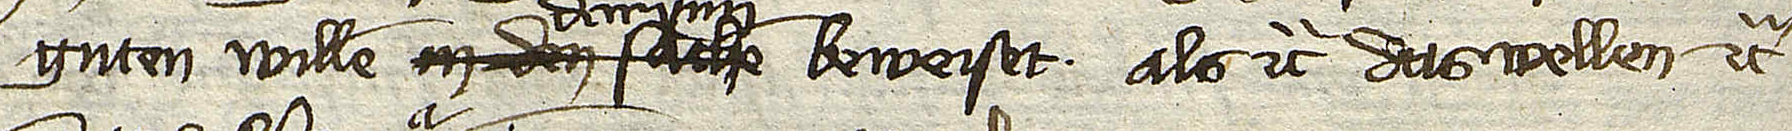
guten wille* in den ſache* beweiſet . als ec* das wellen ec*
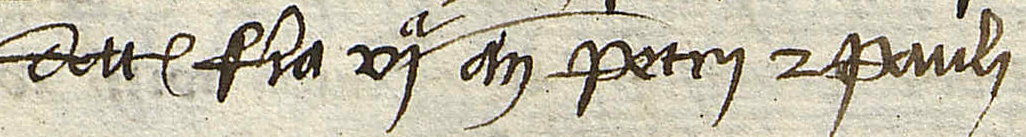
Dat* fia* vi* an* Petri @ Pauli
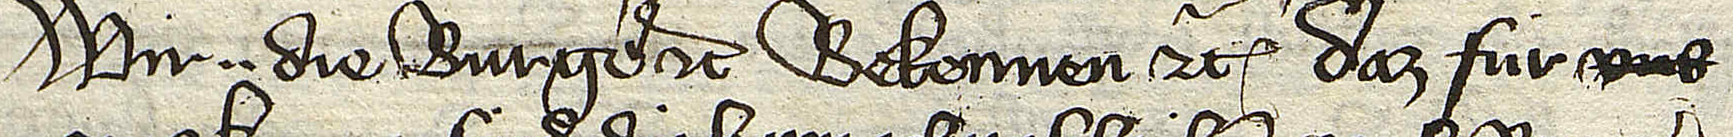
Wir ~ die Burge* ec* Bekennen ec* daʒ für vns
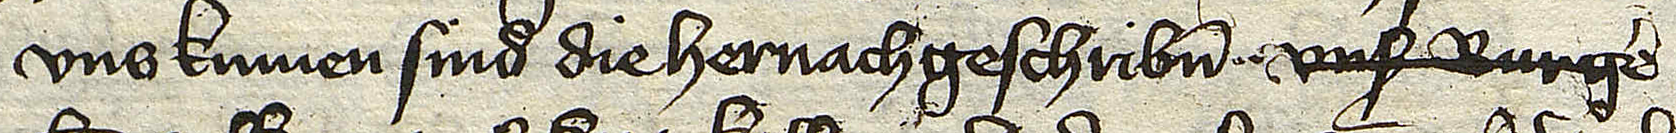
vns kumen ſind die hernach geſchrib*n ~ vnſ* Burge*
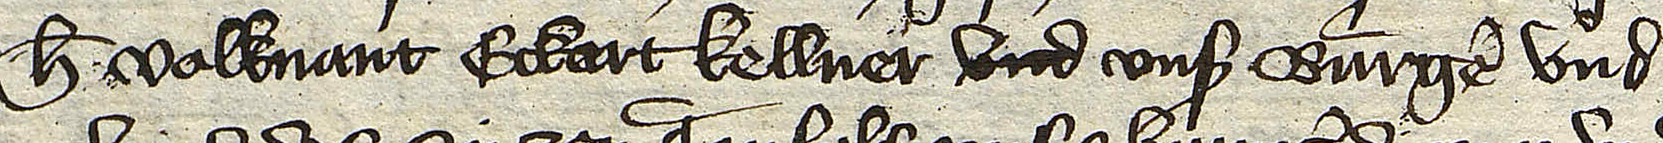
H volknant Eckart Kellner vnd vnſ* Burge* vnd
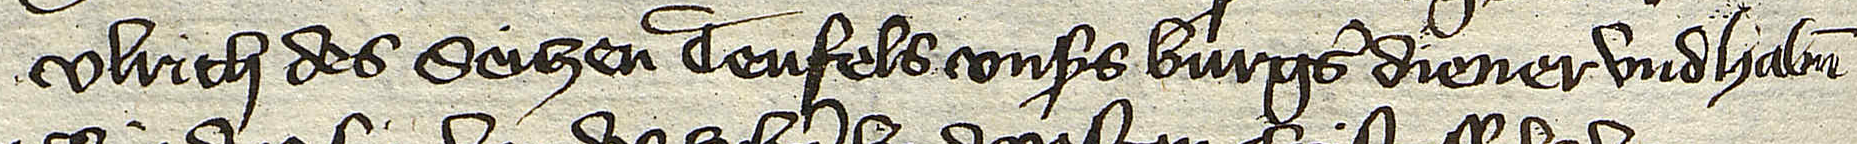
vlrich des Seicʒen Teufels vnſ*s burgs* diener vnd hab*n
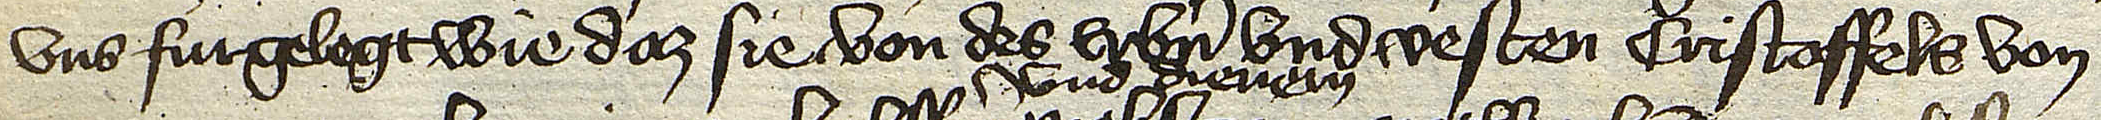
vns fürgelegt wie daʒ ſie von des Erb*n vnd veſten Criſtoffels von
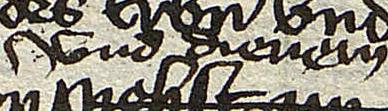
vnd dienern
